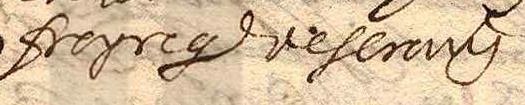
freyre q̄ o escreuj
